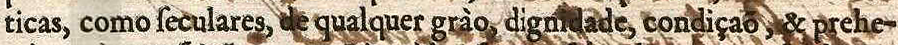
ticas, como seculares, de qualquer grào, dignidade, condiçaõ, & prehe
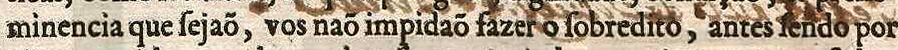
minencia que sejaõ, vos naõ impidaõ fazer o sobredito, antes sendo por
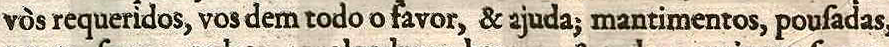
vòs requeridos, vos dem todo o favor, & ajuda; mantimentos, pousadas
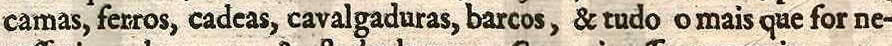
camas, ferros, cadeas, cavalgaduras, barcos, & tudo o mais que for ne
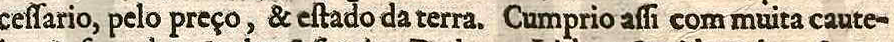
cessario, pelo preço, & estado da terra. Cumprio assi com muita caute
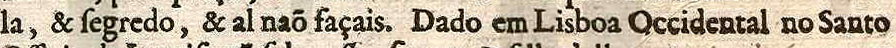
la, & segredo, & al naõ façais. Dado em Lisboa Occidental no Santo
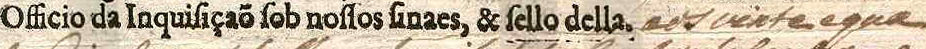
Officio da Inquisiçaõ sob nossos sinaes, & sello della. aos vinte e qua
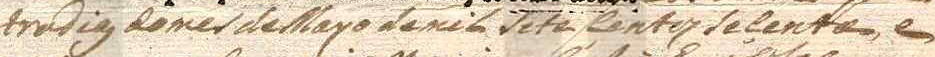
tro dias do mes de Mayo de mil seteCentos secenta, e
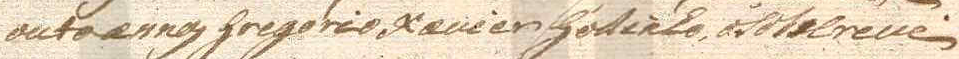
outo annos Gregorio xauier Godinho, o sobscreui
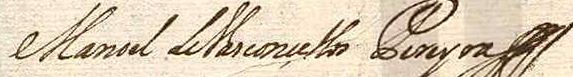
Manoel de Vasconçellos Pereyra
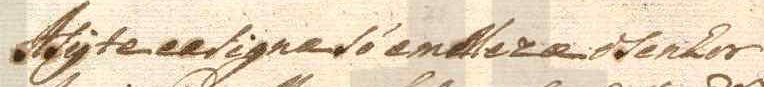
Asiste e asigna só em Meza o senhor
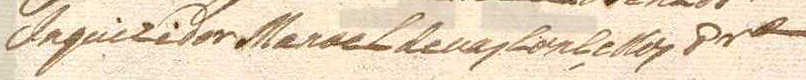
Inquizidor Manoel de uasConcellos Pra
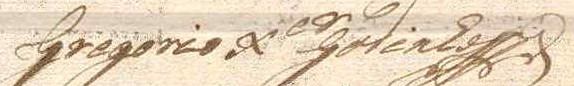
Gregorio Xer Godinho
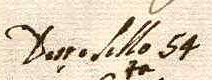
Deste sello 54
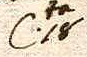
C.ta 18
